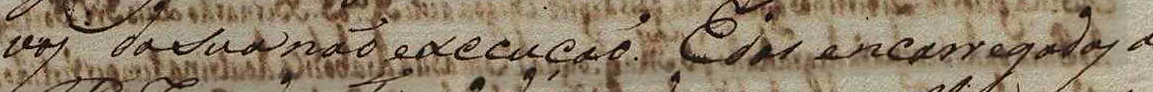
vos da sua naõ execuçaõ. E das encarregadas a
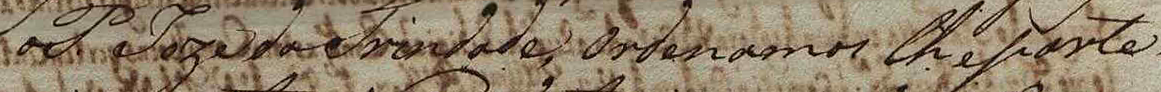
o P Ioze da Trindade, ordenamos lhe parte
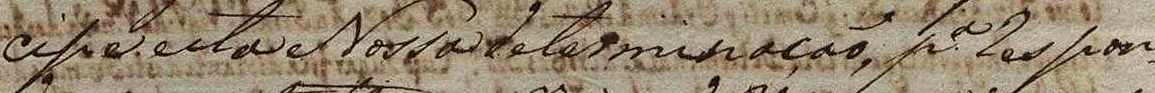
cipe esta Nossa determinaçaõ, p.a Respon
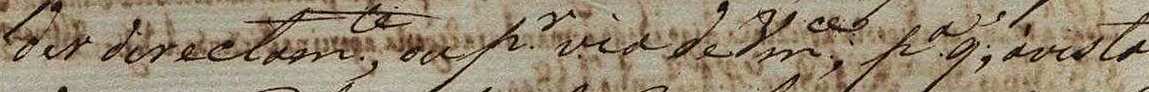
der directam.te, ou p.r via de Vmce, pa q; a vista
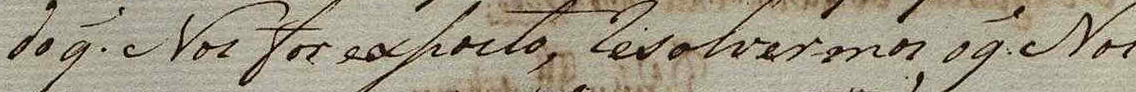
do q̄. Nos for exposto, Resolvermos o q̄ Nos
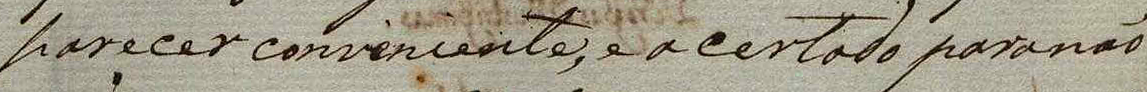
parecer conveniente, e acertado, para naõ
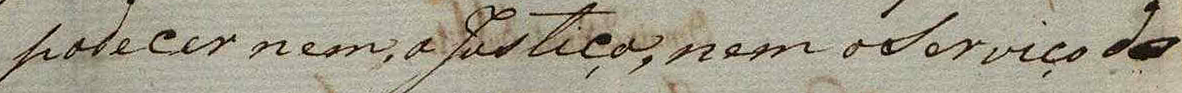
padecer nem, a Justiça, nem o Serviço do
